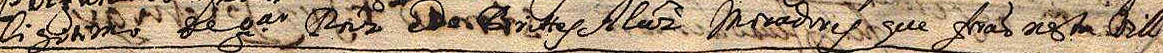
ligitimo de g.ar Roiz̄ e de Brittes Aluz̄ Moradores que foraõ nesta Vill
